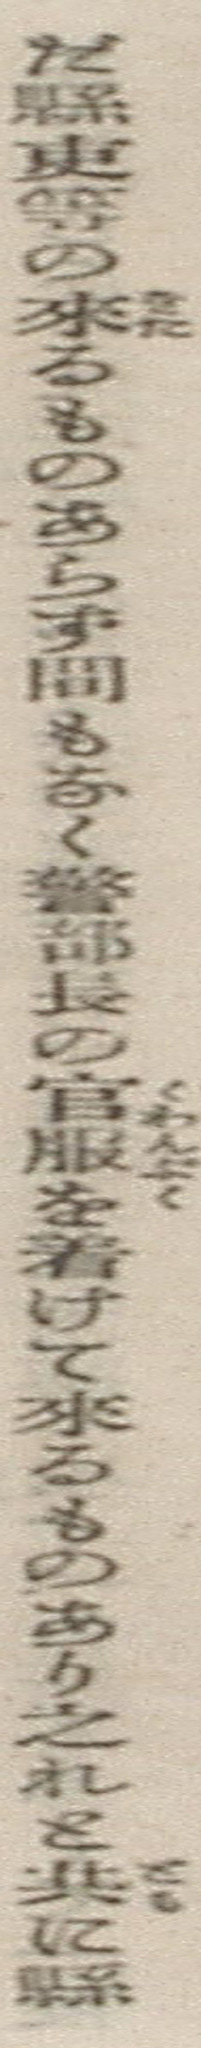だ県吏等の来るものあらず間もなく警部長の官服を着けて来るものあり之れと共に県
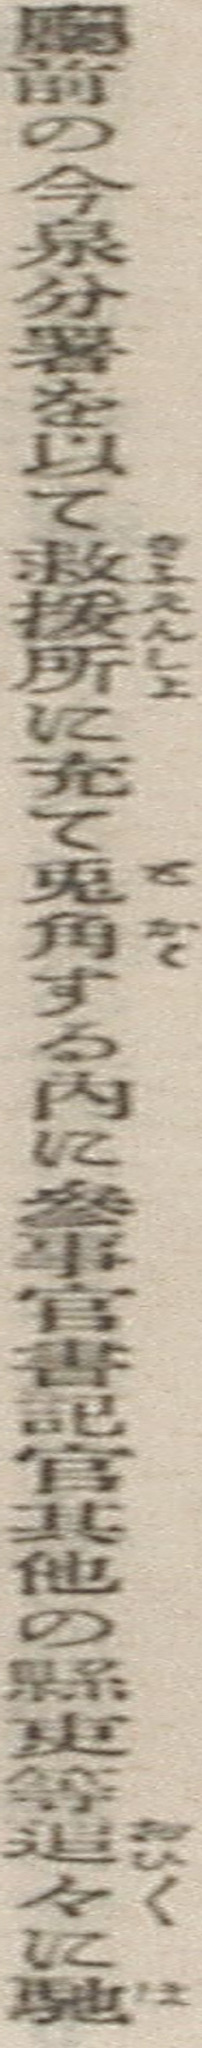庁前の今泉分署を以て救援所に充て兎角する内に参事官書記官其他の県吏等追々に馳
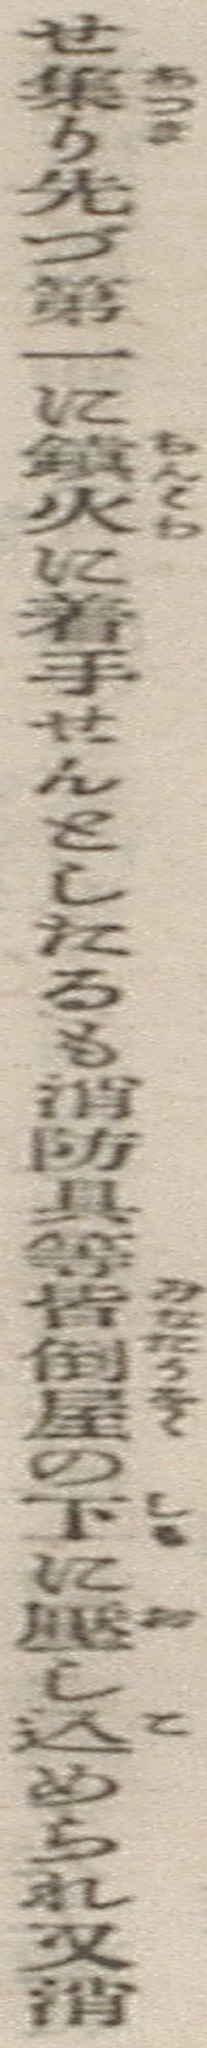せ集り先づ第一に鎮火に着手せんとしたるも消防具等皆倒屋の下に圧し込められ又消
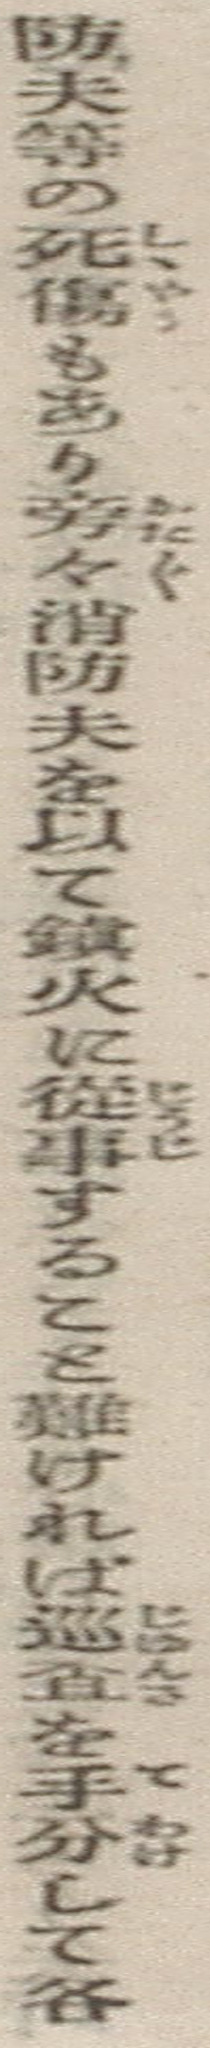防夫等の死傷もあり旁々消防夫を以て鎮火に従事すること難ければ巡査を手分して各
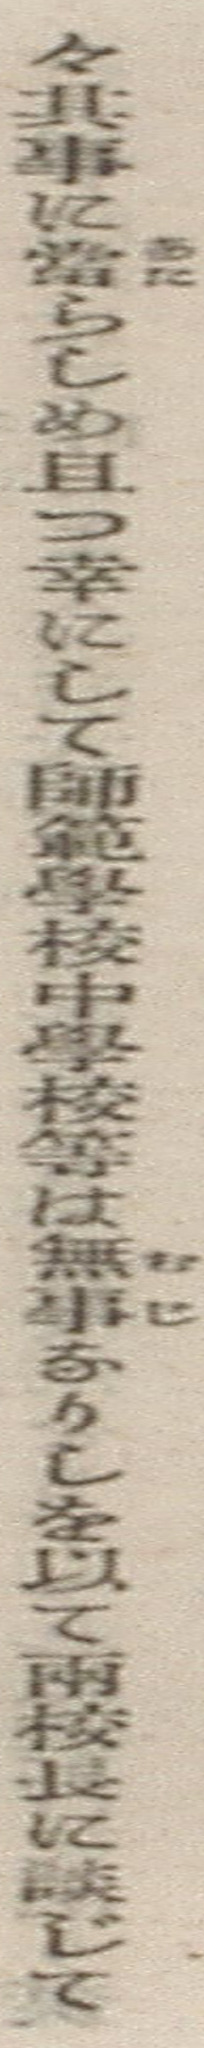々其事に当らしめ且つ幸にして師範学校中学校等は無事なりしを以て両校長に談じて
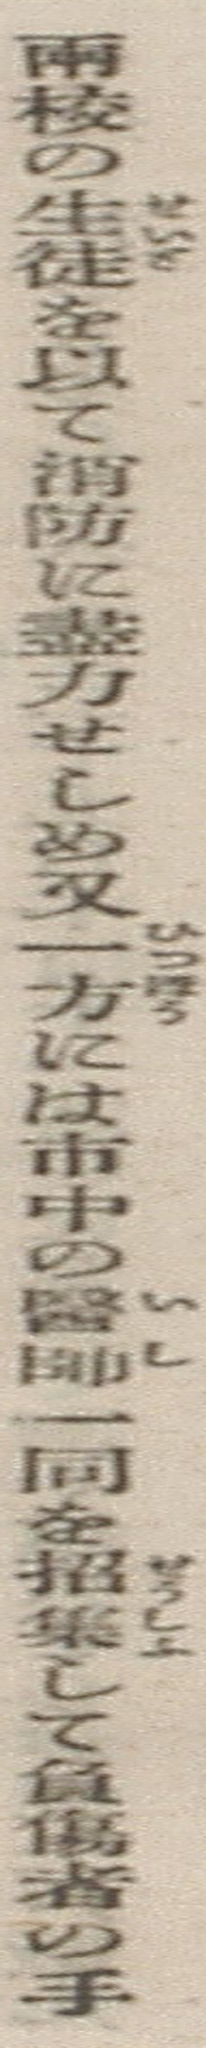両校の生徒を以て消防に尽力せしめ又一方には市中の医師一同を招集して負傷者の手
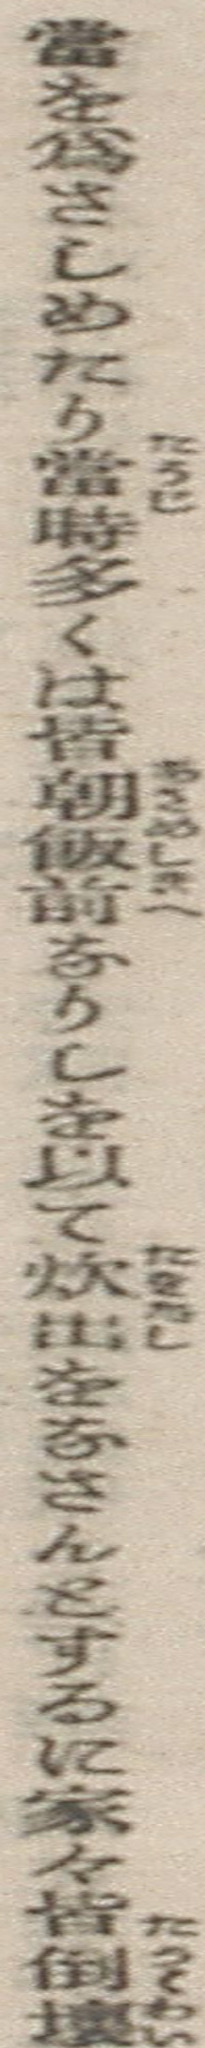当を為さしめたり当時多くは皆朝飯前なりしを以て炊出をなさんとするに家々皆倒壊
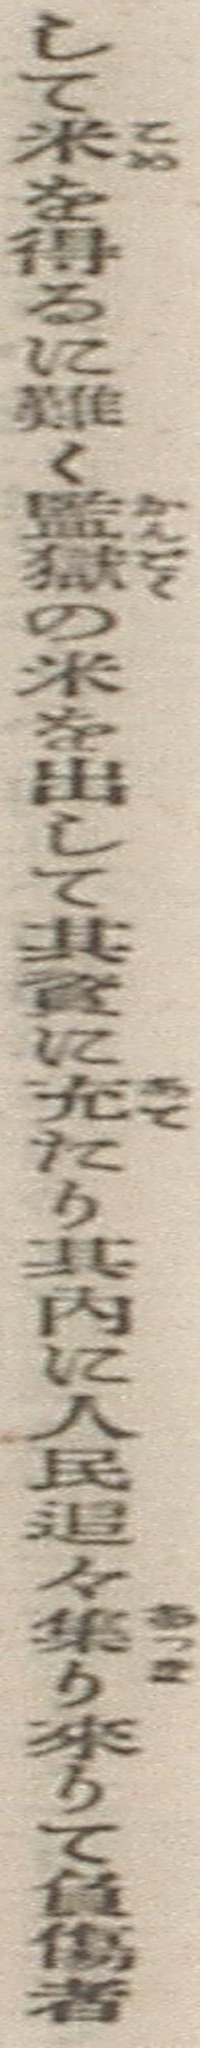して米を得るに難く監獄の米を出して其資に充たり其内に人民追々集り来りて負傷者
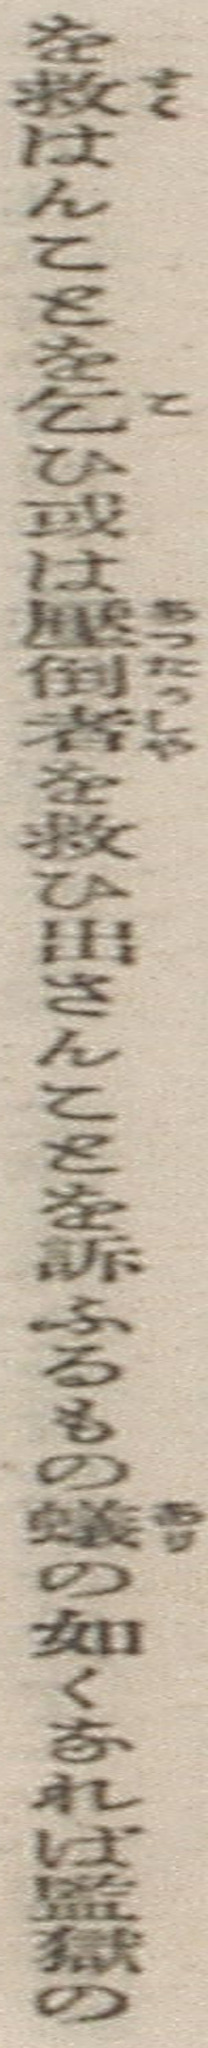を救はんことを乞ひ或は圧倒者を救ひ出さんことを訴ふるもの蟻の如くなれば監獄の
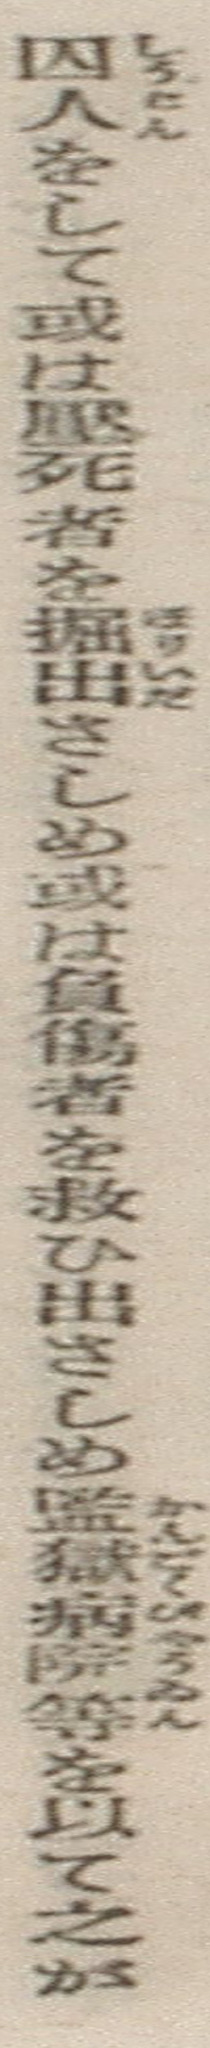囚人をして或は圧死者を掘出さしめ或は負傷者を救ひ出さしめ監獄病院等を以て之が
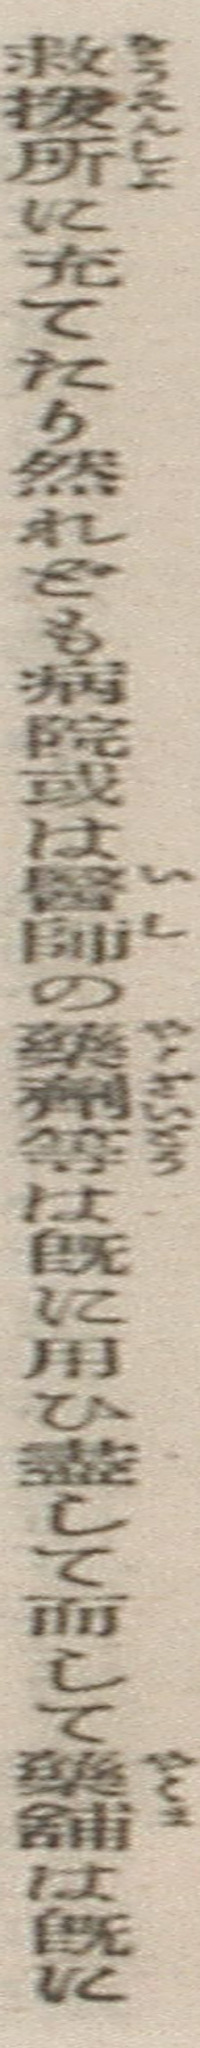救援所に充てたり然れども病院或は医師の薬剤等は既に用ひ尽して而して薬舗は既に
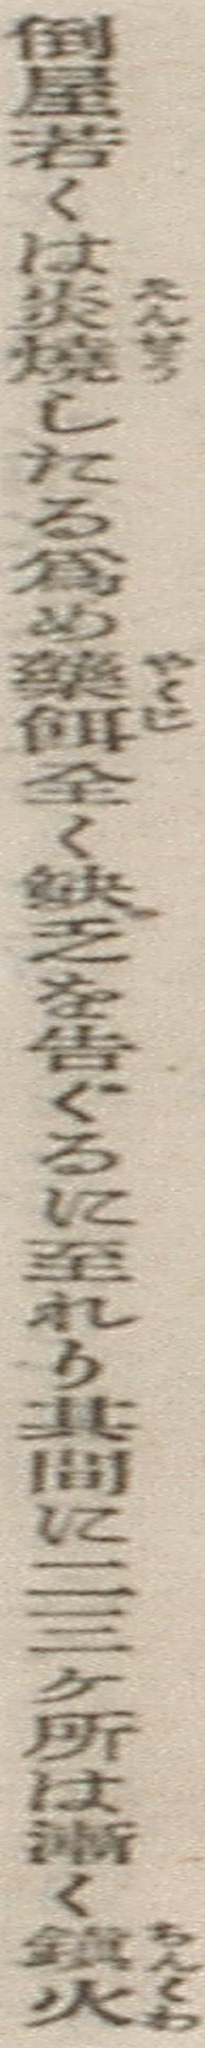倒屋若くは炎焼したる為め薬餌全く欠乏を告ぐるに至れり其間に二三ヶ所は漸く鎮火
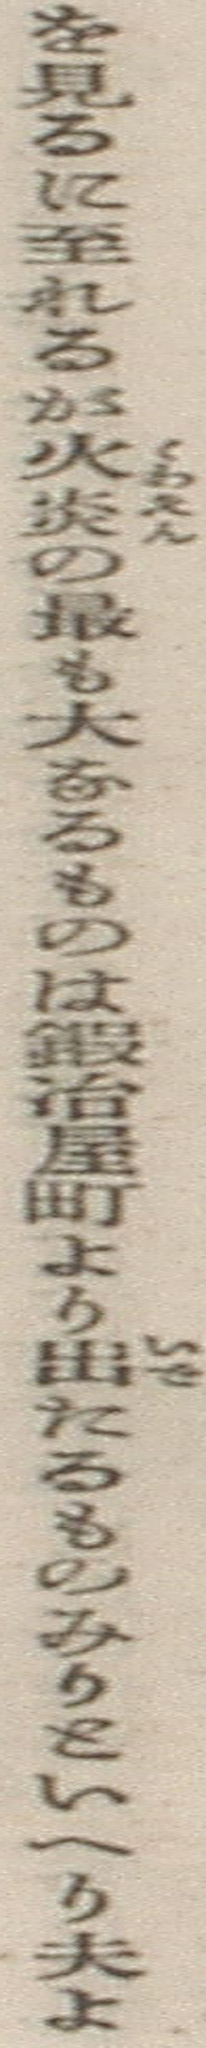を見るに至れるが火炎の最も大なるものは鍛冶屋町より出たるものみりといへり夫よ
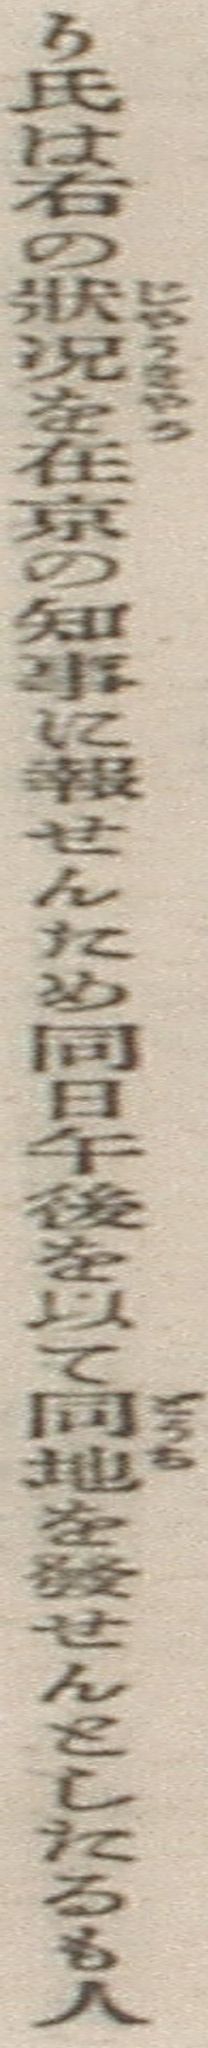り氏は右の状況を在京の知事に報せんため同日午後を以て同地を発せんとしたるも人
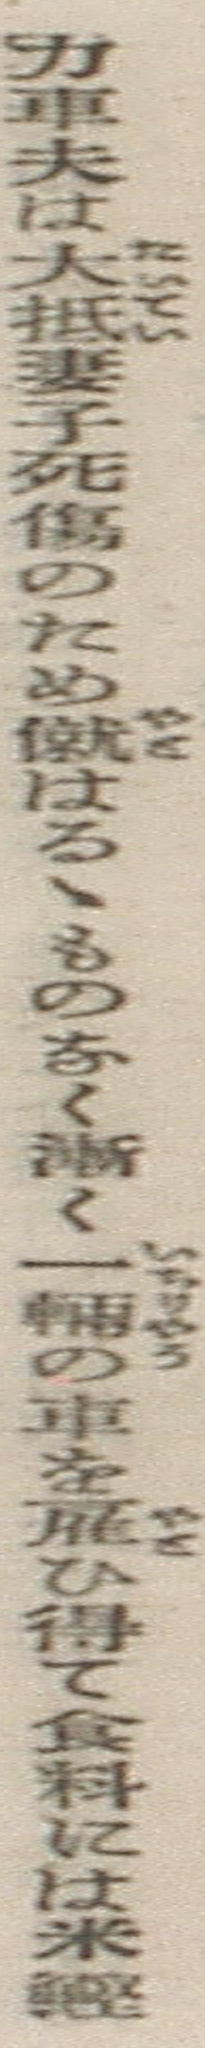力車夫は大抵妻子死傷のため僦はるゝものなく漸く一輌の車を雇ひ得て食料には米鰹
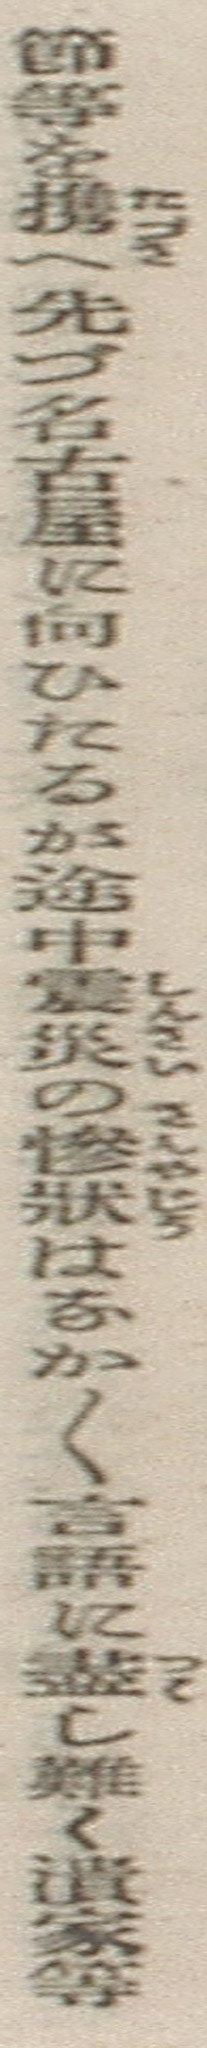節等を携へ先づ名古屋に向ひたるが途中震災の惨状はなか〳〵言語に尽し難く潰家等
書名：愛知岐阜福井三県　大地震見聞録（内題）
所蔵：東京大学地震研究所図書室 Earthquake Research Institute Library, The University of Tokyo, JAPAN
